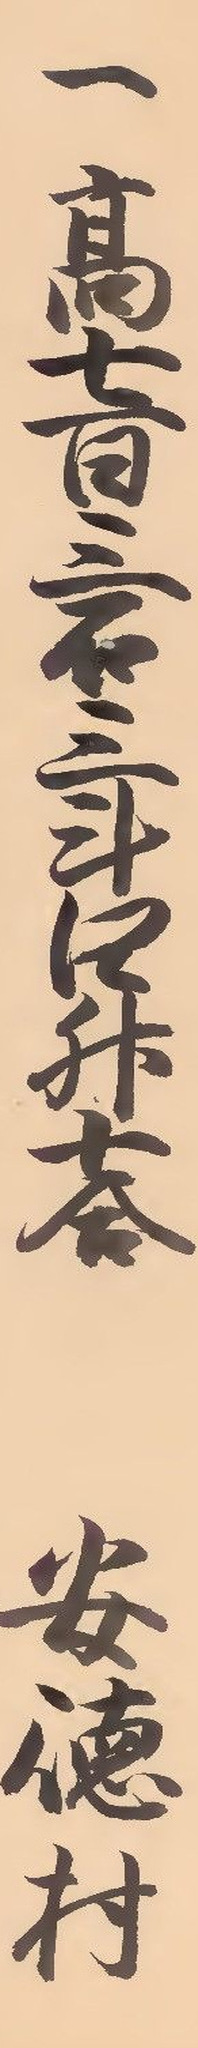一高七百三石三斗四升七合安徳村
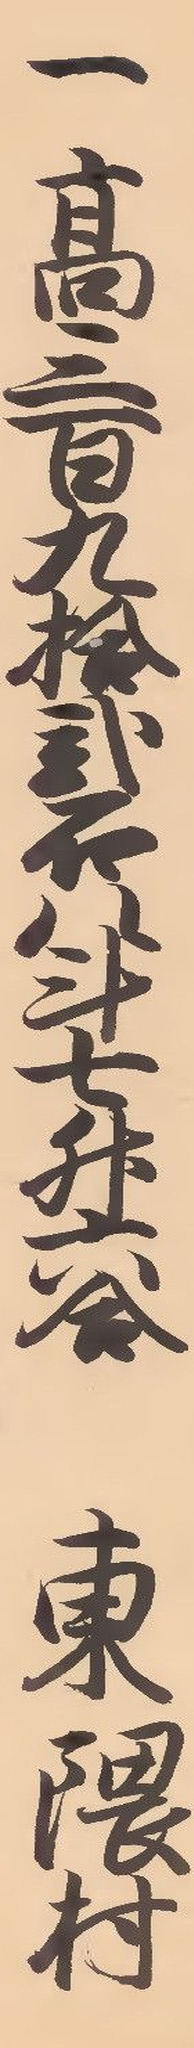一高三百九拾弐石八斗七升六合東隈村
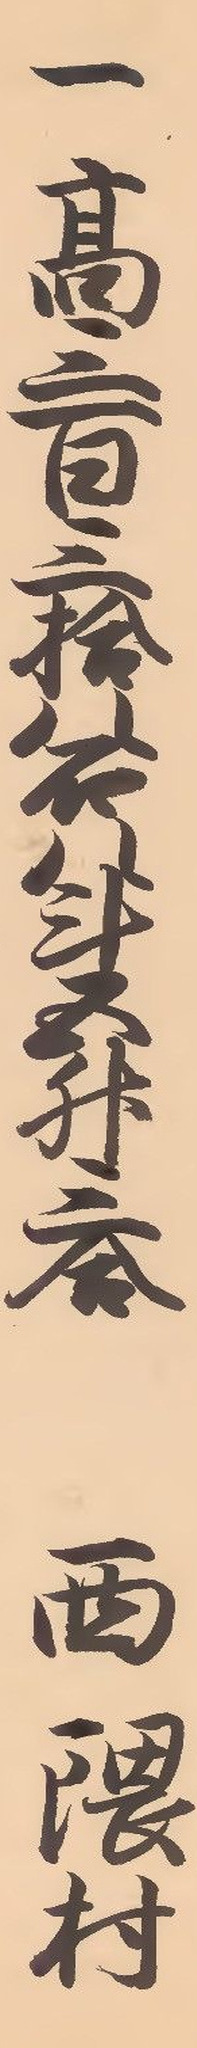一高三百三拾八石八斗五升三合西隈村
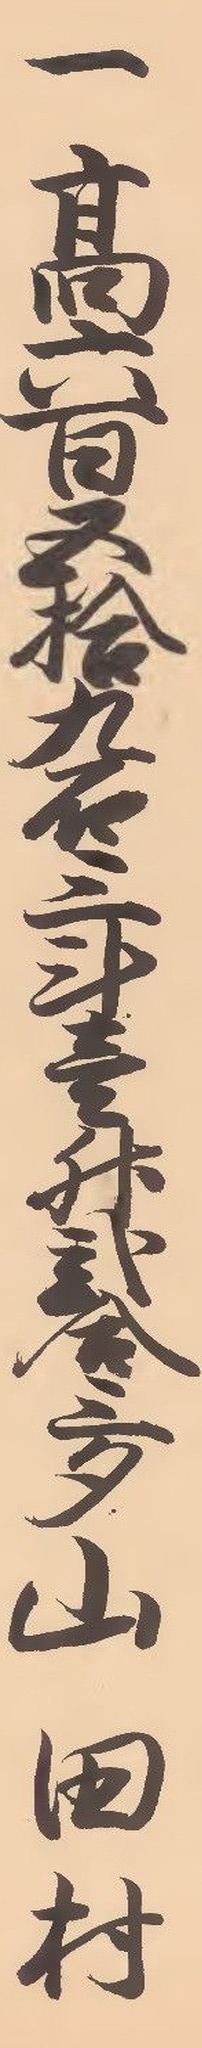一高六百五拾九石三斗壱升弐合三勺山田村

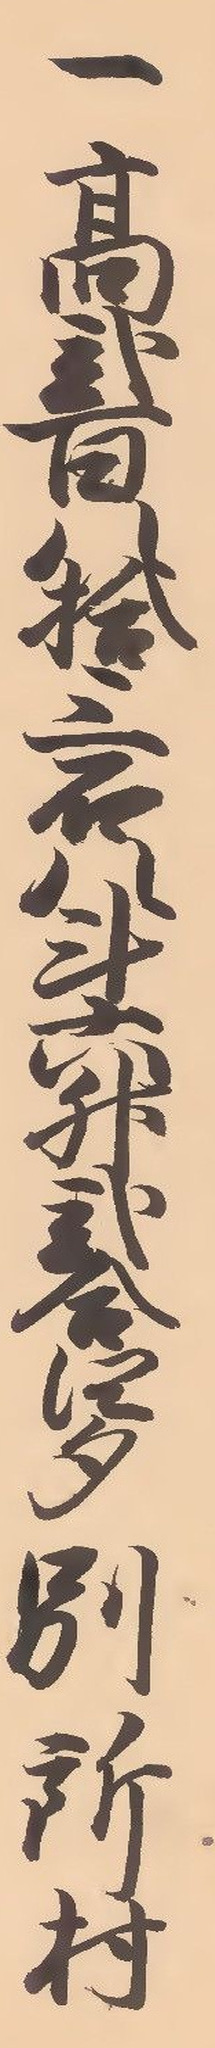一高弐百八拾三石八斗六升弐合四勺別所村
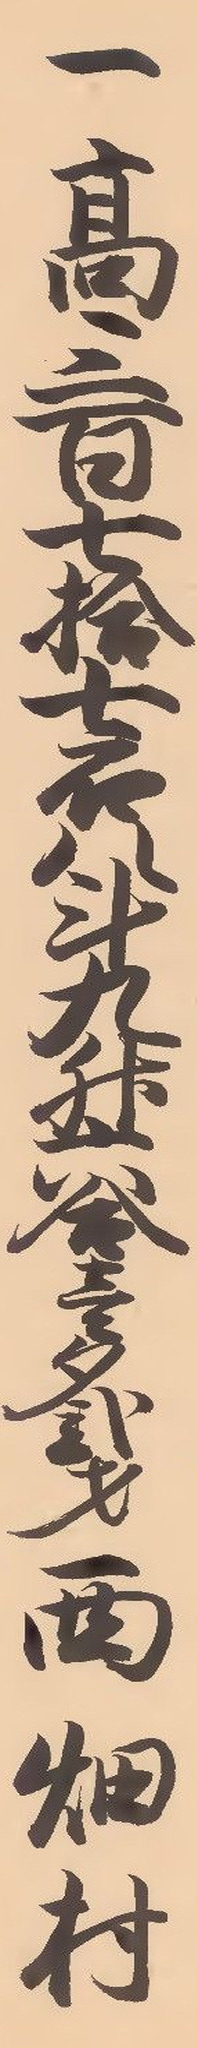一高三百七拾七石八斗九升六合壱勺弐才西畑村
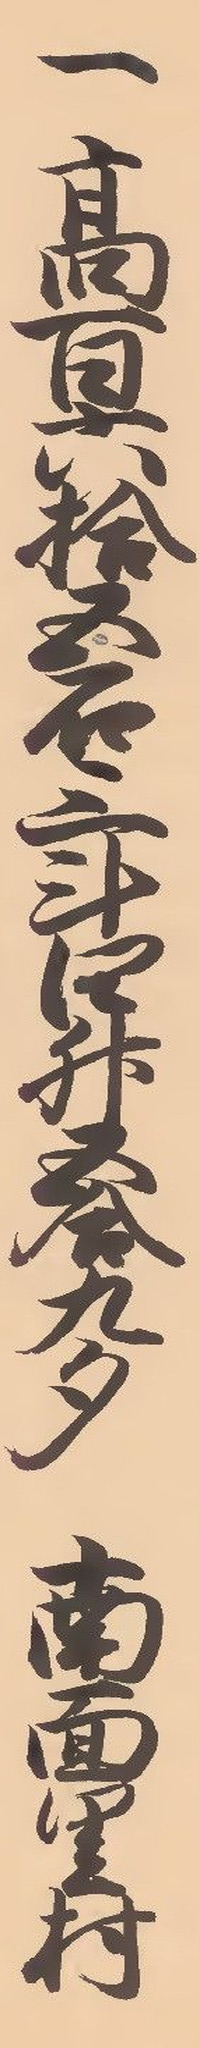一高百六拾五石三斗四升五合九勺南面里村
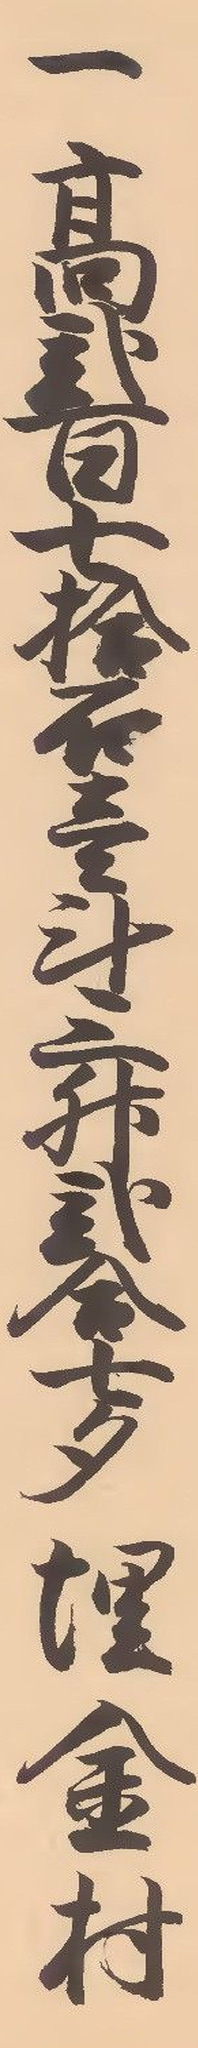一高弐百七拾石壱斗三升弐合七勺埋金村
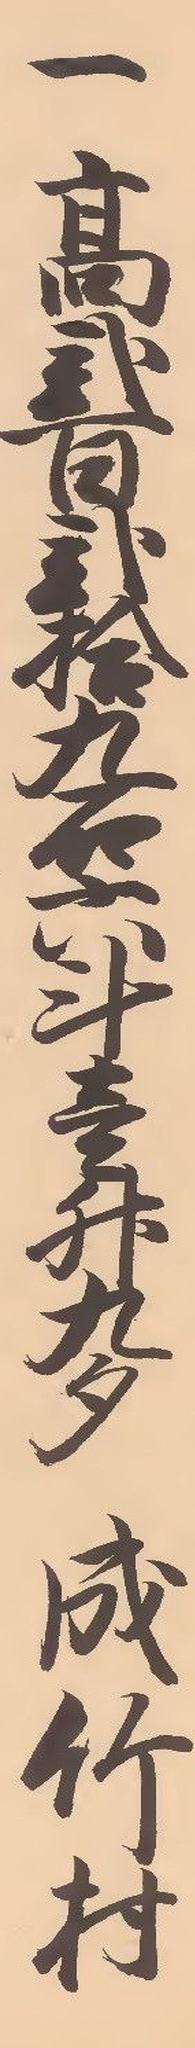一高弐百弐拾九石六斗壱升九勺成竹村
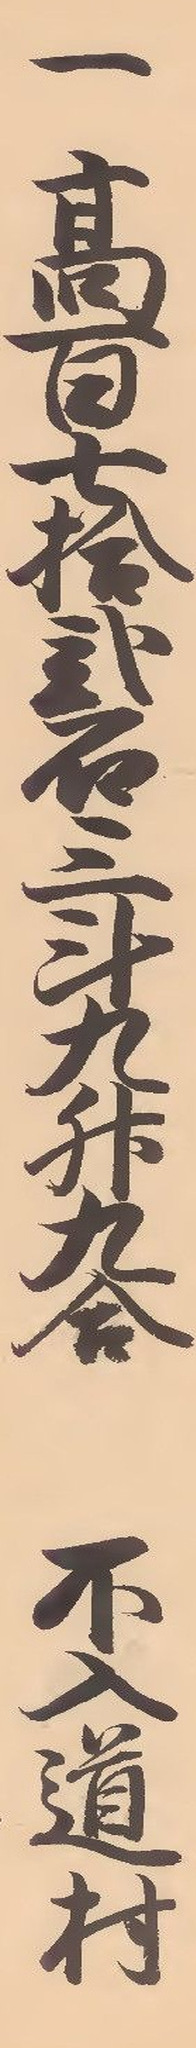一高百七拾弐石三斗九升九合不入道村

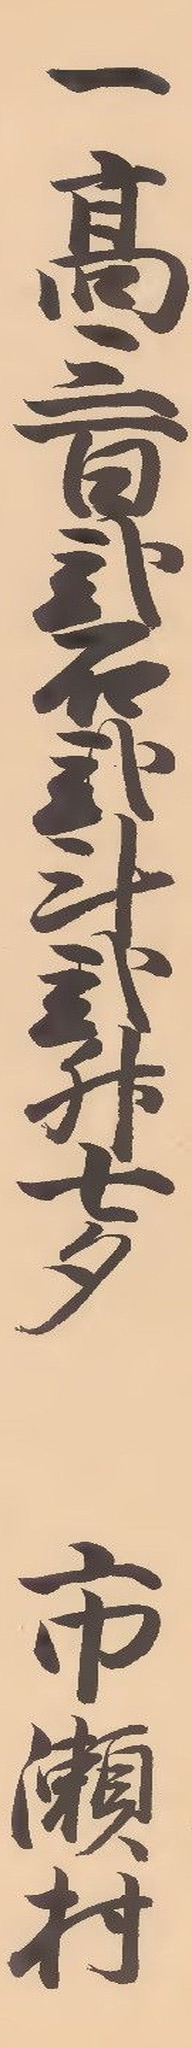一高三百弐石弐斗弐升七勺市瀬村
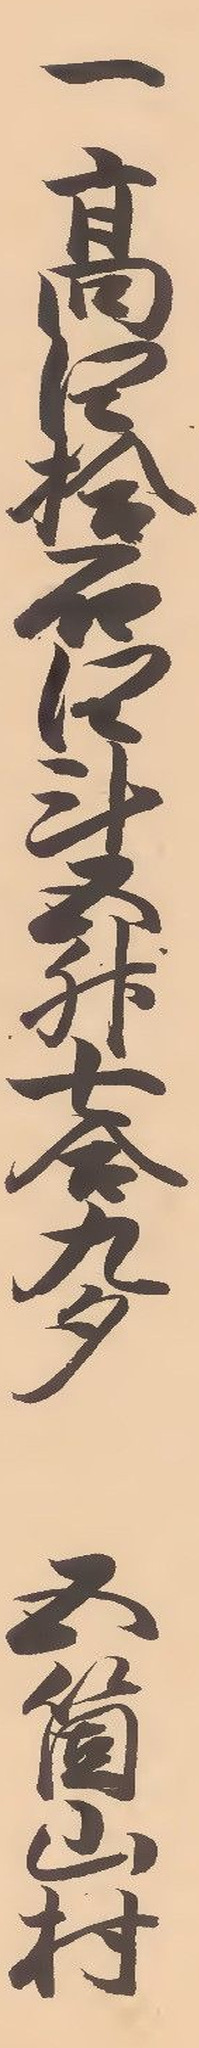一高四拾石四斗五升七合九勺五箇山村
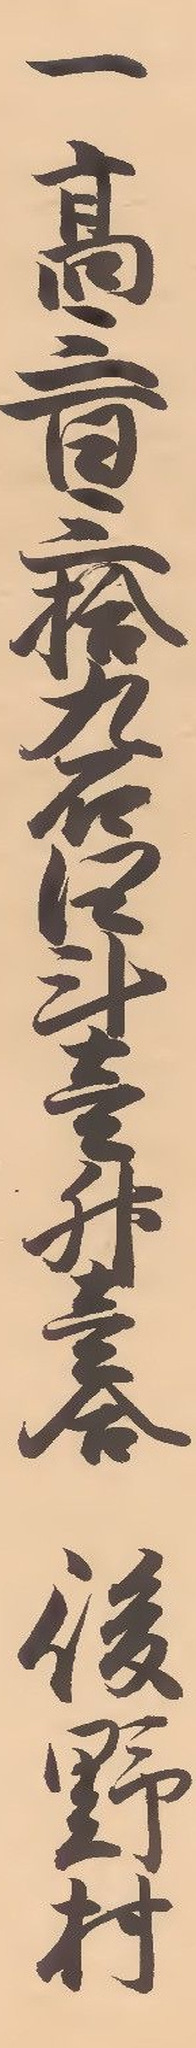一高三百三拾九石四斗壱升壱合後野村
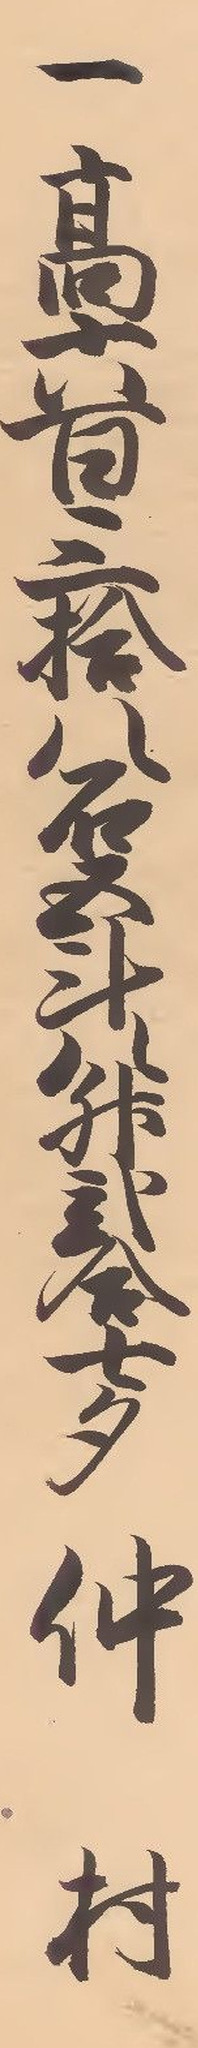一高六百三拾八石五斗八升弐合七勺仲村

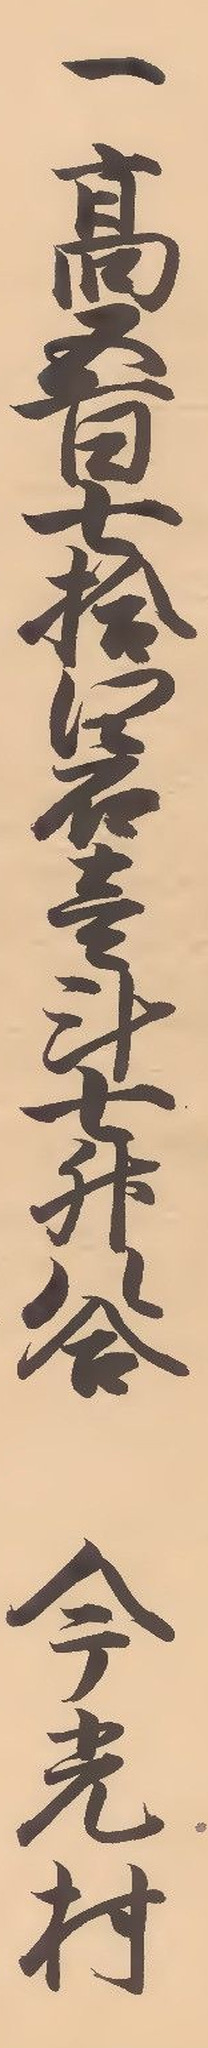一高五百七拾四石壱斗七升八合今光村
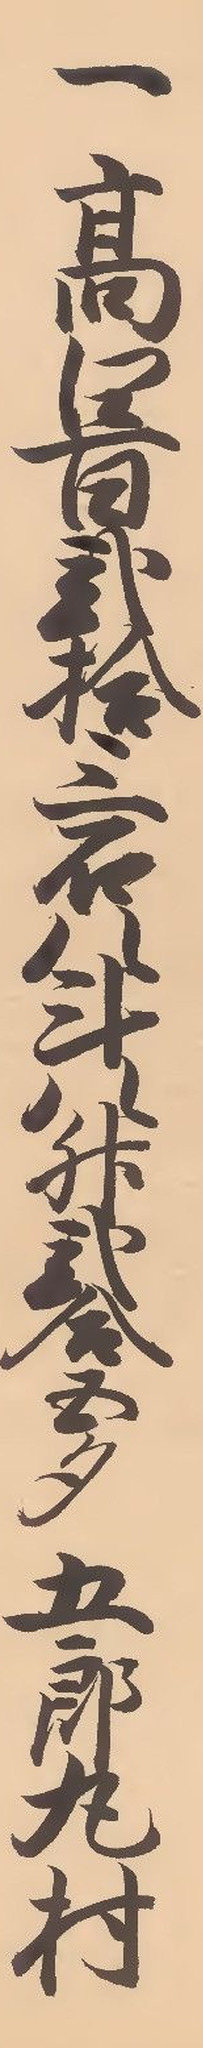一高四百弐拾三石八斗八升弐合五勺五郎丸村
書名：筑前国郷帳
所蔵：国立公文書館 National Archives of Japan
